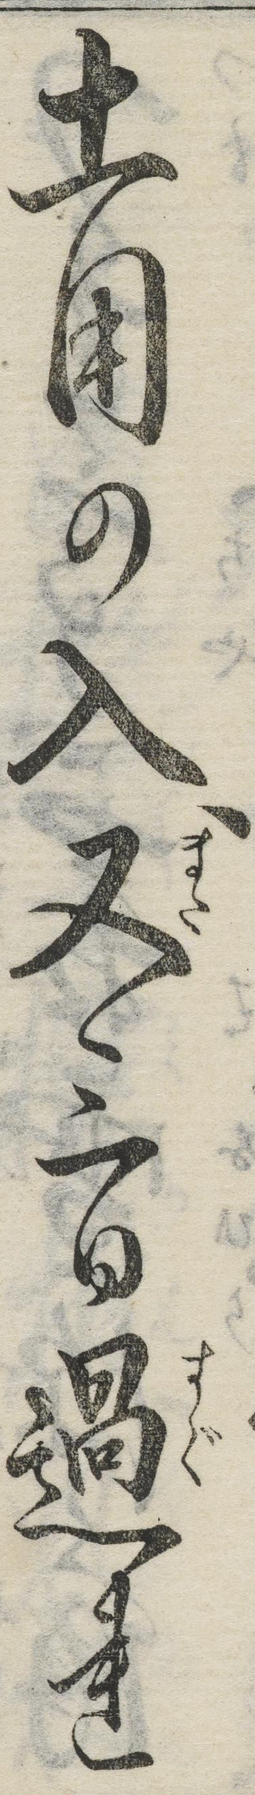土用の入、又三日過れ
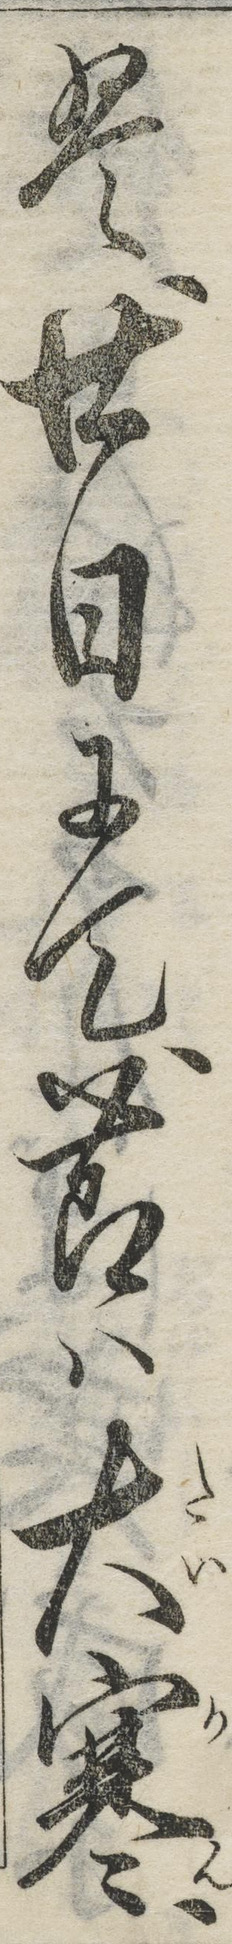ば、廿日にて、節は大寒、
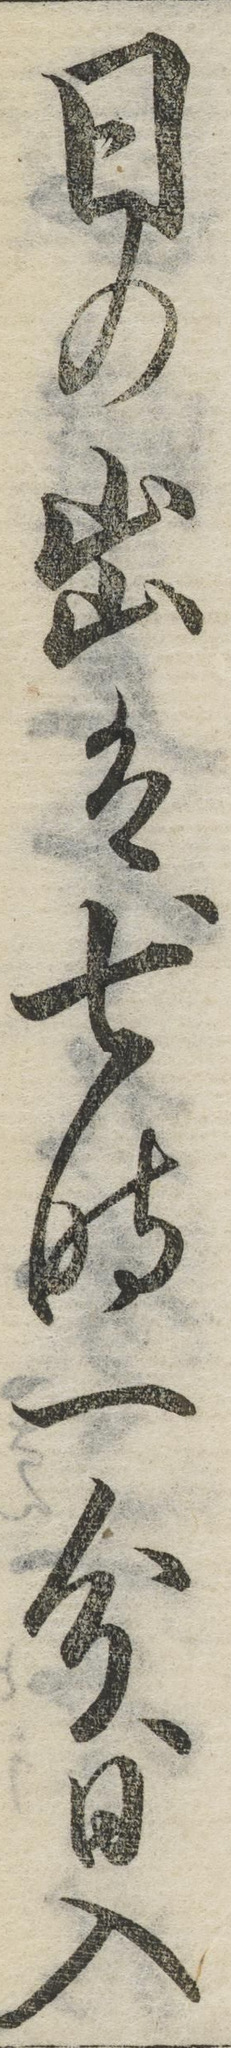日の出は、七時一分、日入

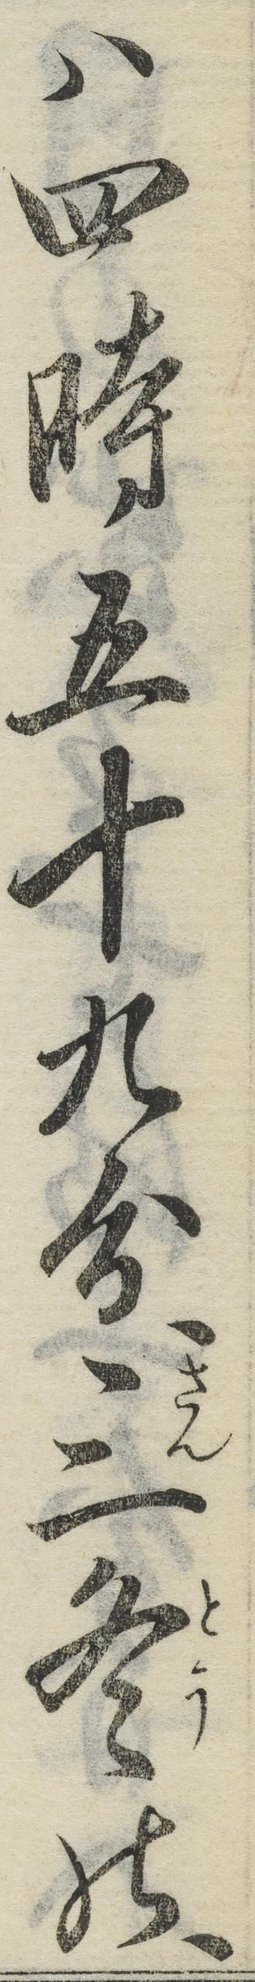は四時五十九分、三冬の、
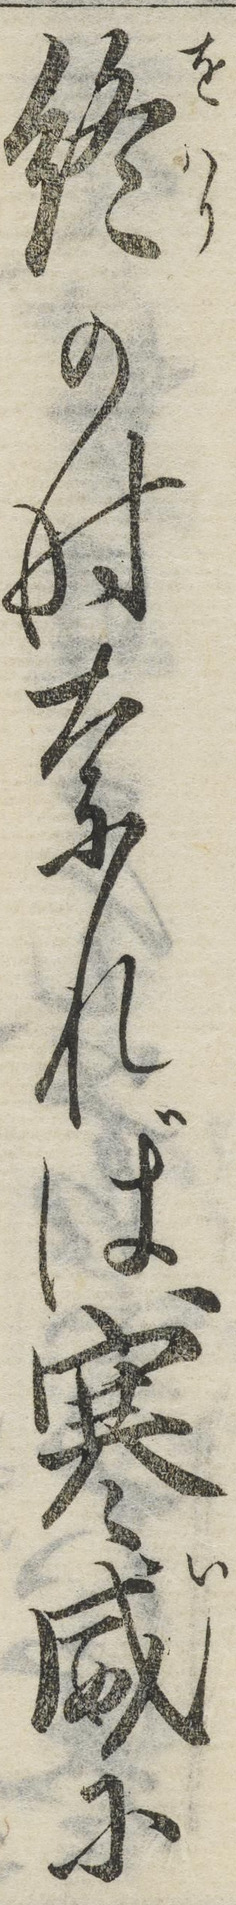終の時なれば、寒威に
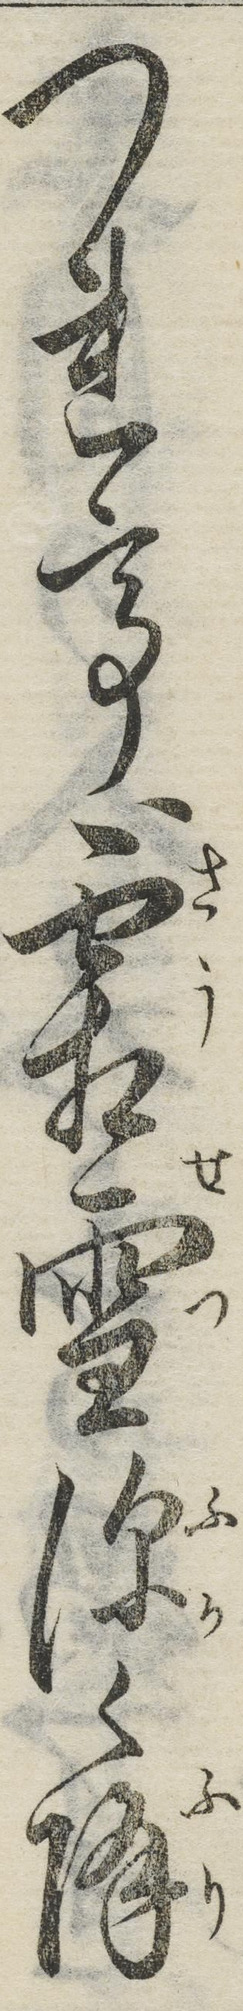つれて、霜雪深く降
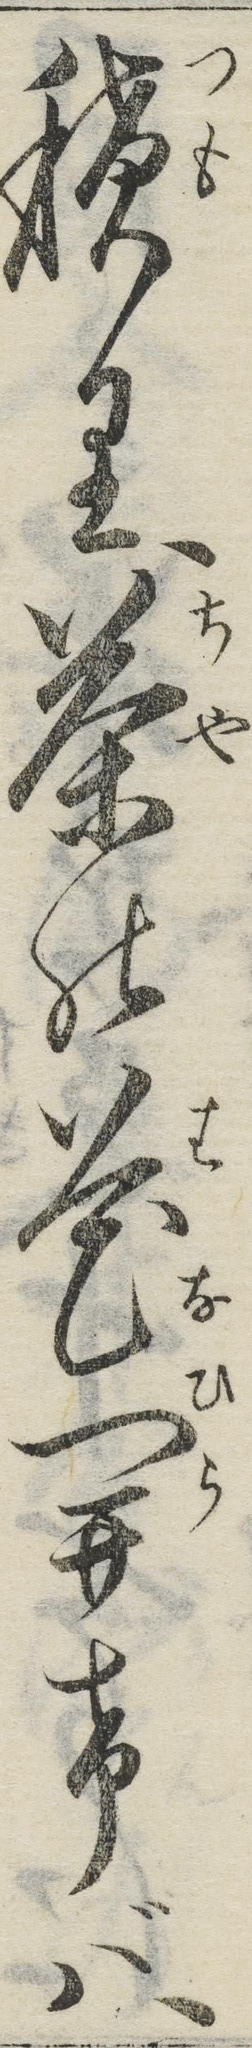積り、茶の花開けば、
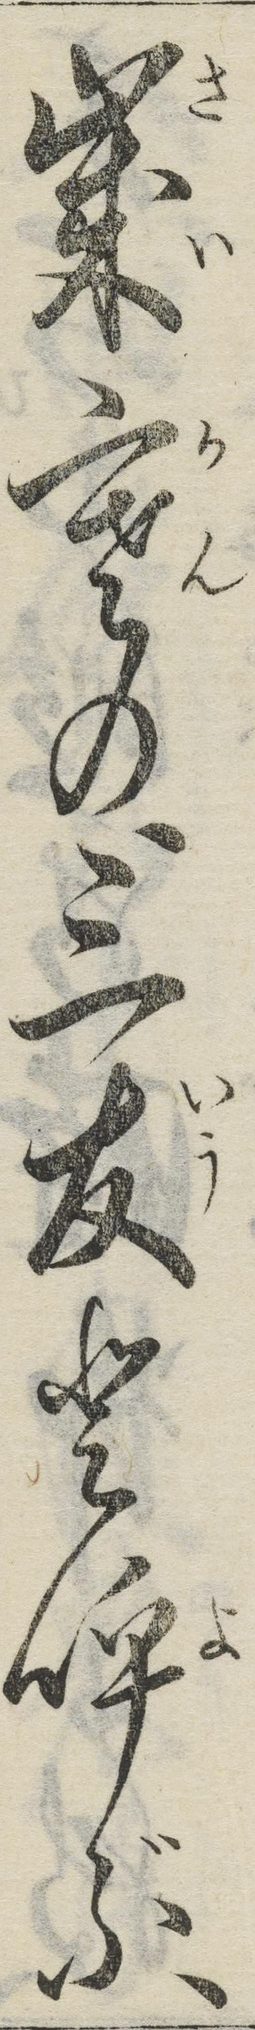歳寒の三友と呼ぶ、
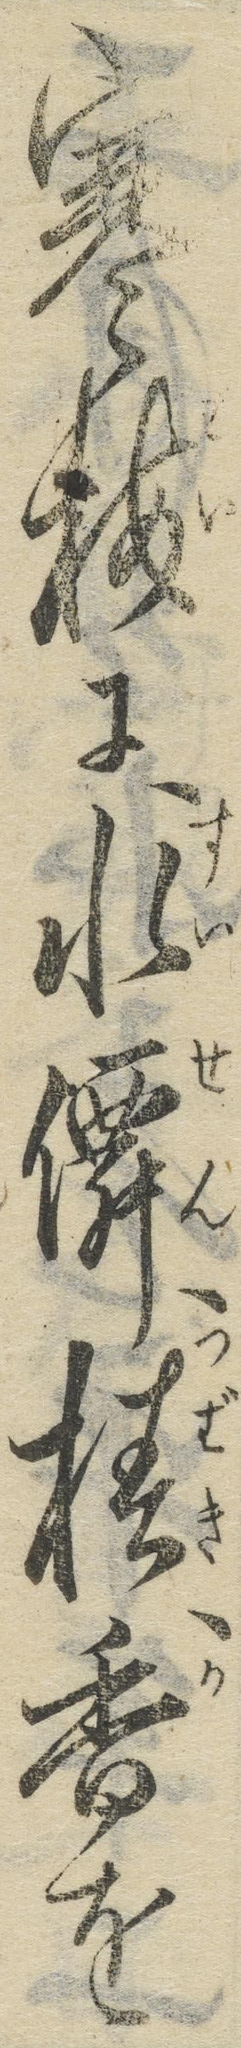寒梅に、水仙、椿、香を
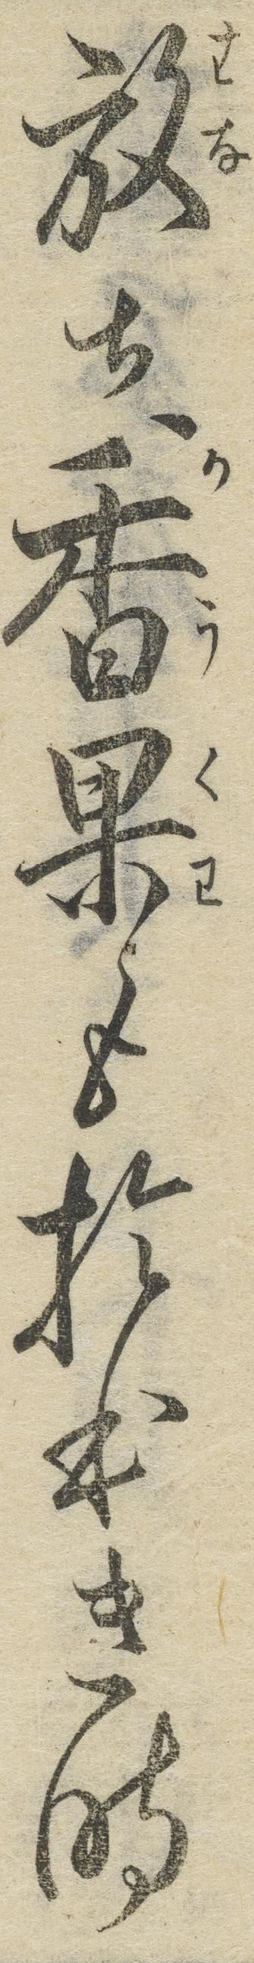放ち、香果もおほき時
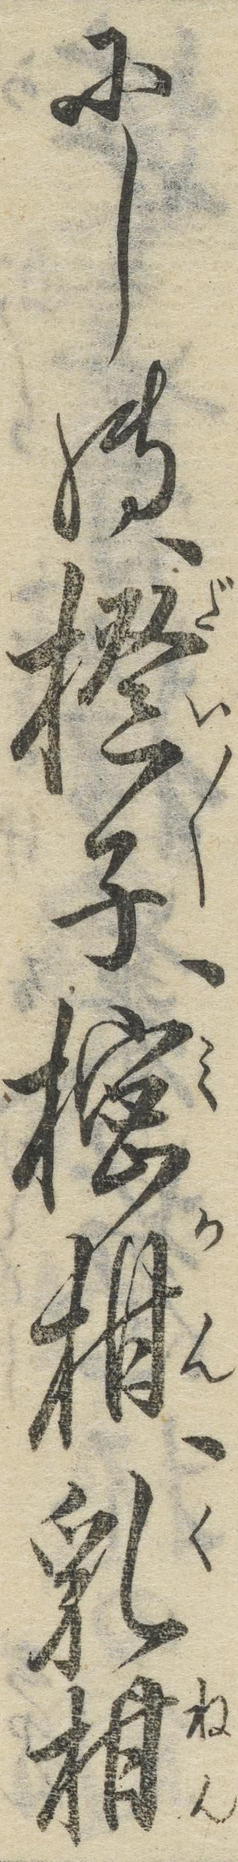なりて、橙子、蜜柑、乳担
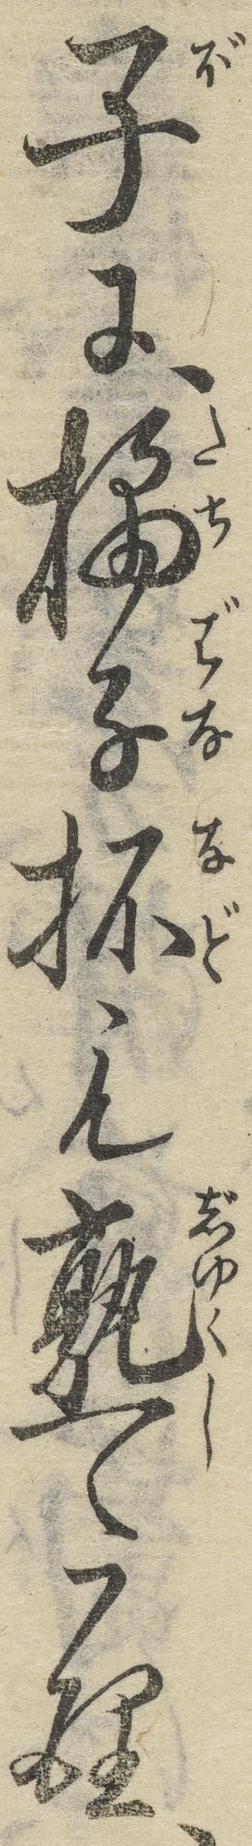子に、橘子抔も熟たり、
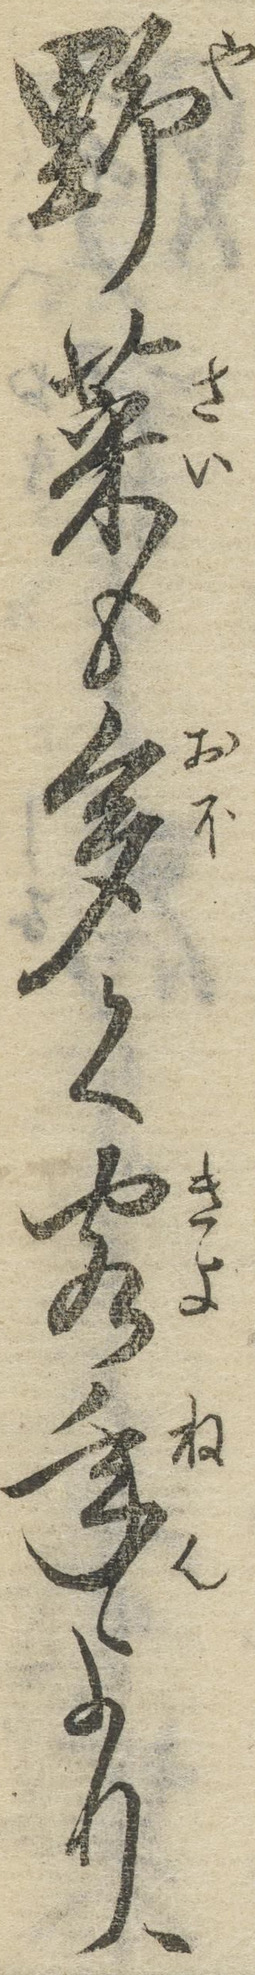野菜も多く究年より、

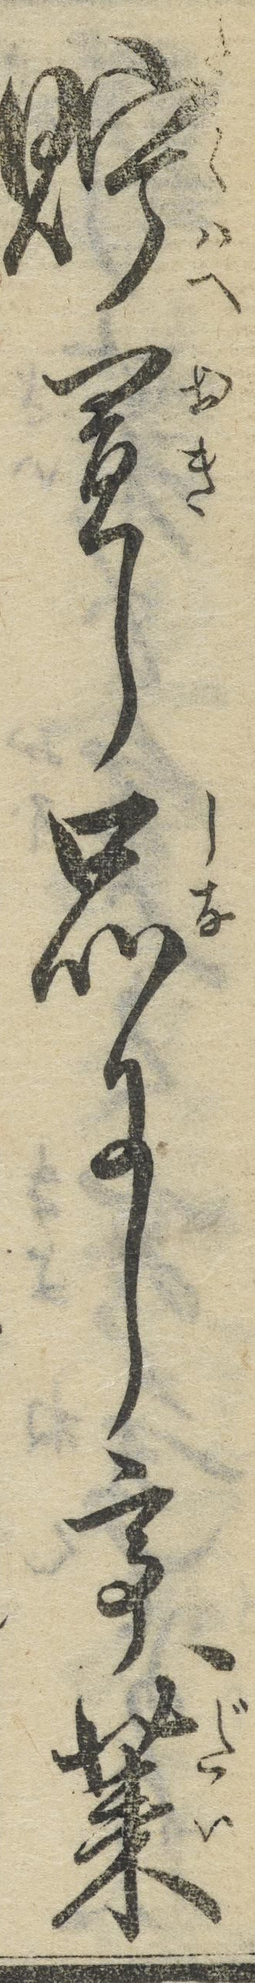貯置し品にして、菜
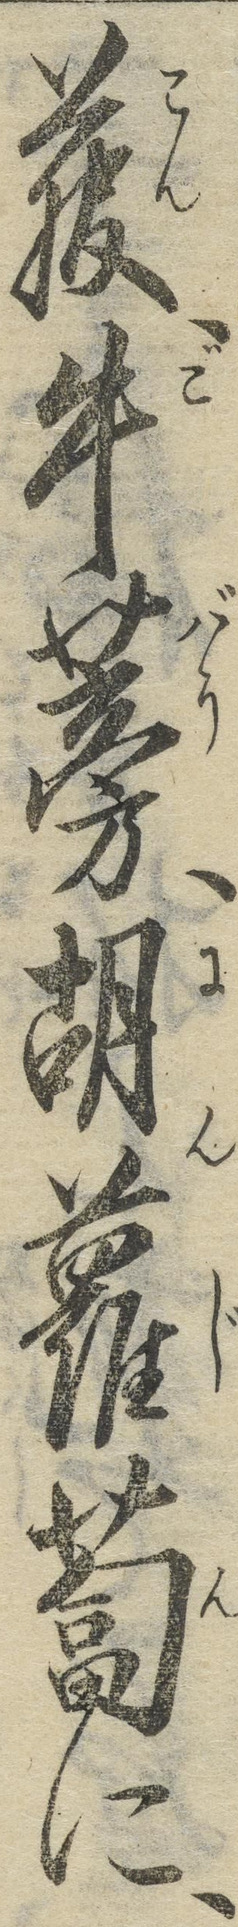菔、牛蒡、胡蘿蔔に、
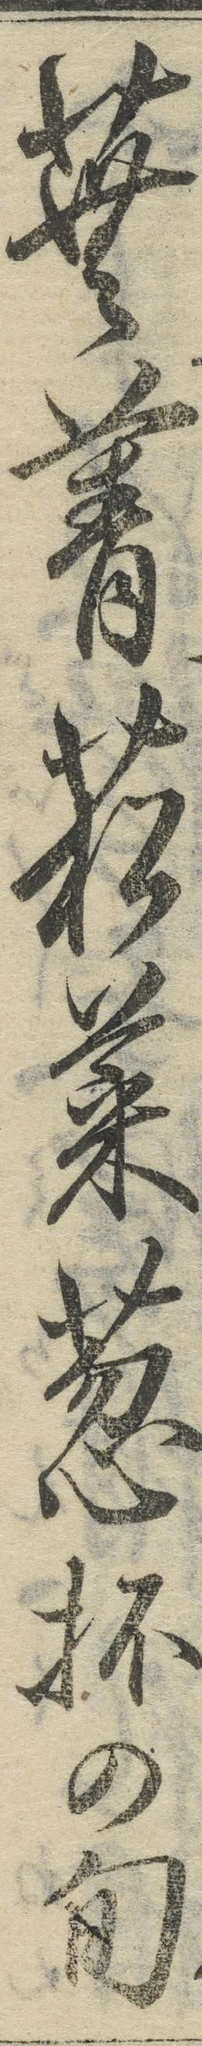蕪菁、菘菜、葱抔の旬
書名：暦日往来　單
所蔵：東京大学地震研究所図書室 Earthquake Research Institute Library, The University of Tokyo, JAPAN
